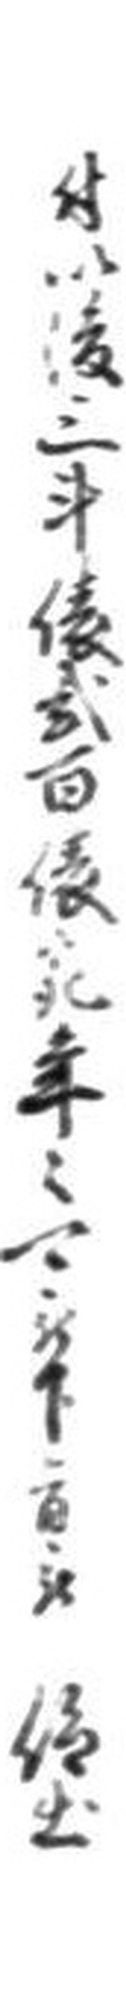付以後三斗俵弐百俵宛年々可被下旨被仰出
